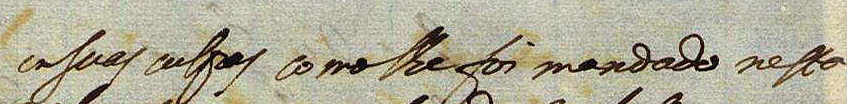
em suas culpas como lhe foi mandado nesta
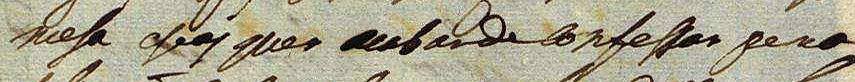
mesa e se as quer acabar de confessar pera
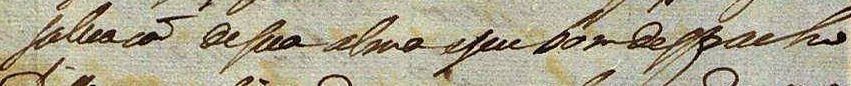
saluaçaõ de sua alma e seu bom despacho
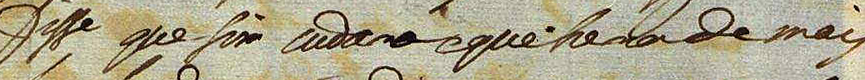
Disse que sim cudara e que hera de mais
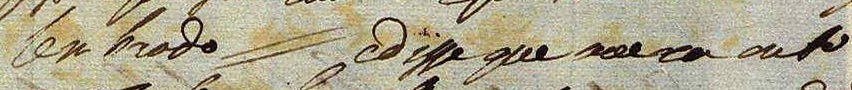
lembrado e disse que auera outo
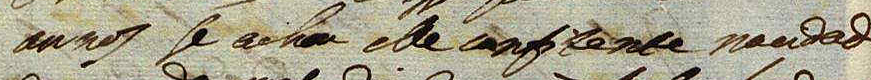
annos se achou elle confitente na cidad
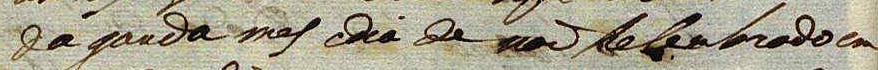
da gauda mes e dia de naõ he lembrado em
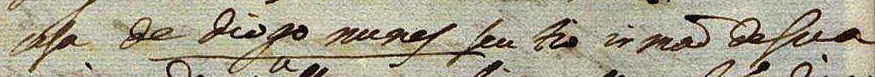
casa de diogo nunes seu tio irmaõ de sua
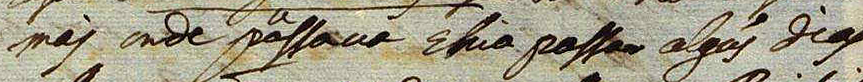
maj onde passaua E hia passar algūs dias
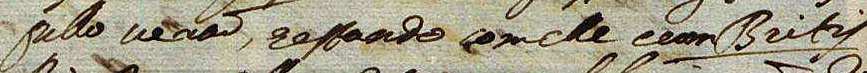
pello ueraõ, e estando com elle e com Britis
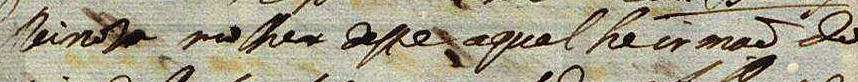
Reinoza molher desse a qual he irmaõ do
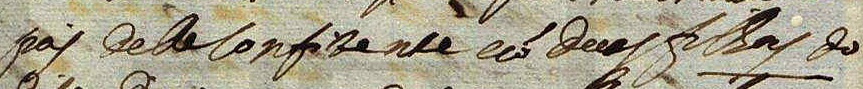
paj delle confitente e cō duas filhas do
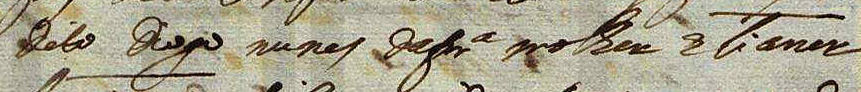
dito Diogo nunes da pra molher E lianor
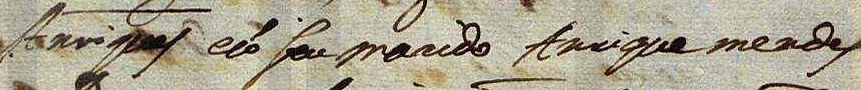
Anriques e cō seu marido Anrique mendes
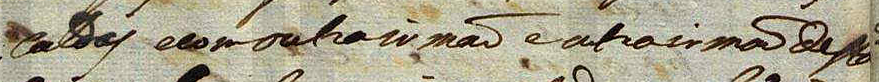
caldas e com outro irmaõ e outra irmā desta
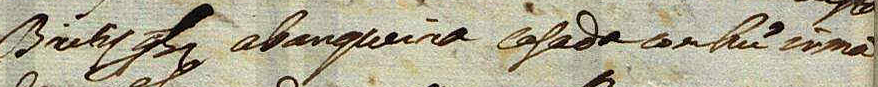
Britis gl̄z a banqueira casada com hū irmaõ
